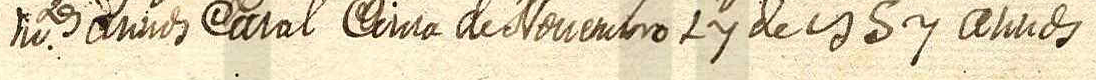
m.tos annos Casal Cinza de Nouembro 17 de 1757 annos
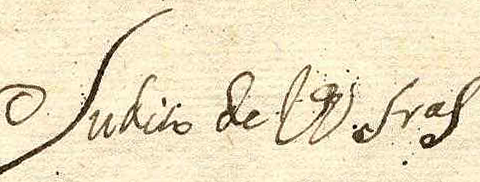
Sudito de VV S.ras
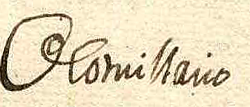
O Comissario
